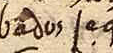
bados / e q̄
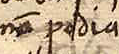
nā podia
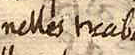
nelles traba
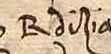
o R dizia
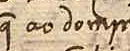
q̄ ao domjn
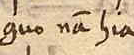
guo nā hia
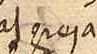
a Jgreja /
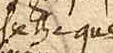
e sse lhe que
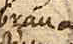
braua o
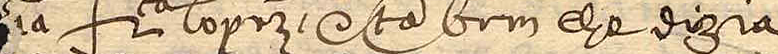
_a Frca. lopez̄, e tābem lhe dizia
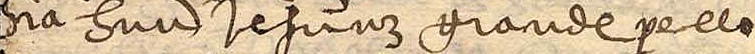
_ia huū Jejūm grande pello
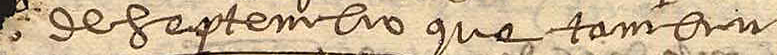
_ de septembro que tambem
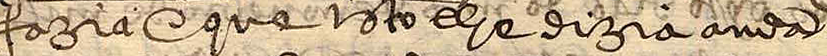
fazia e que isto lhe dizia andā
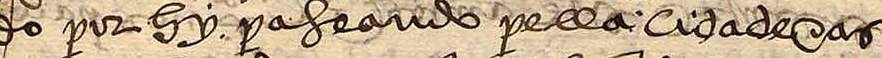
do por hy paseando pella cidade e as
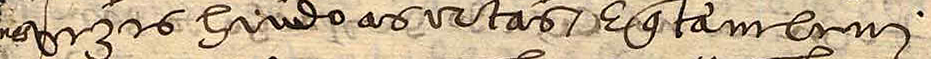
vezes hindo as ortas/ E q̄ tāmbem
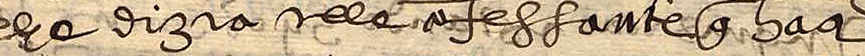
lhe dizia elle cōfessante q̄ haa
